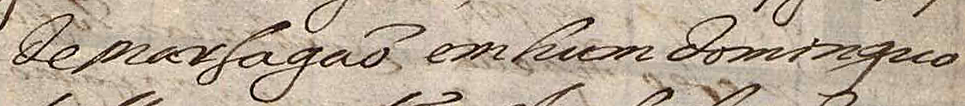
de marsagaõ em hum dominguo
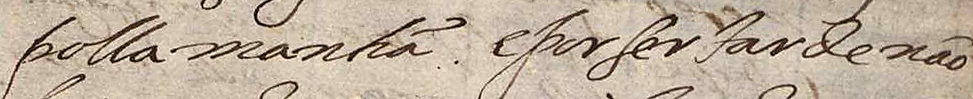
polla manhā E por ser tarde naõ
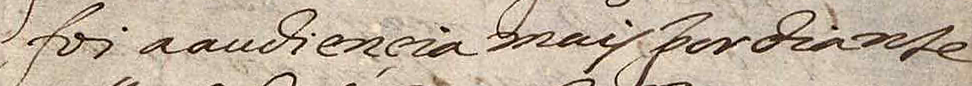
foi a audiencia mais por diante
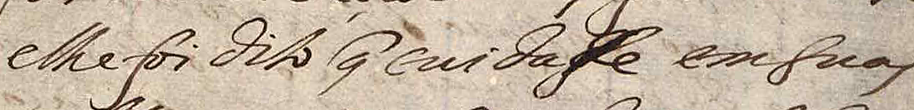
e lhe foi dito q̄ cuidase em suas
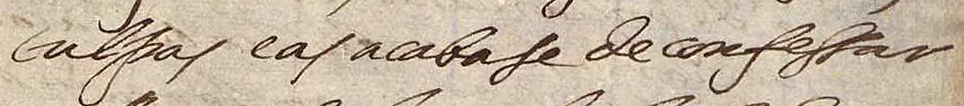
culpas e as acabase de confessar
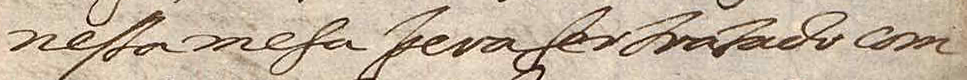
nesta mesa pera ser tratado com
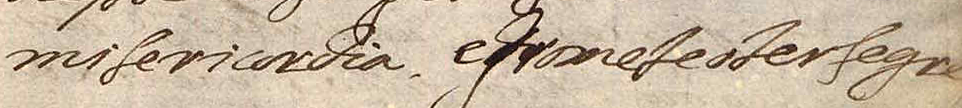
misericordia, e prometeo ter segre
